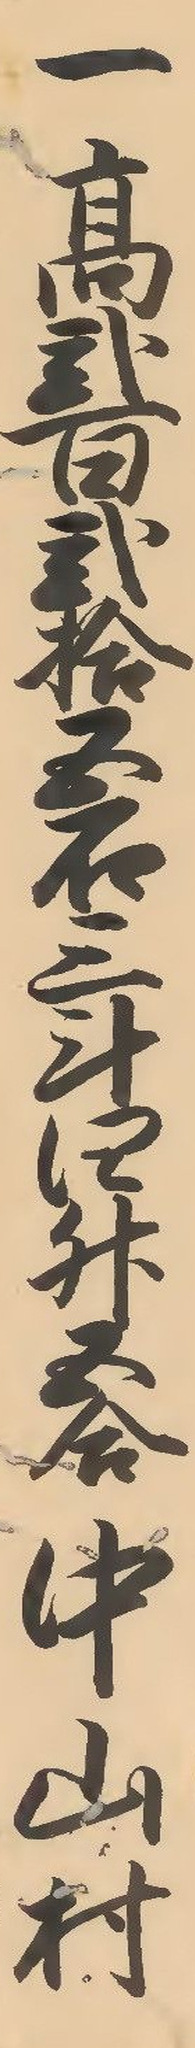一髙弐百弐拾五石三斗四升五合中山村

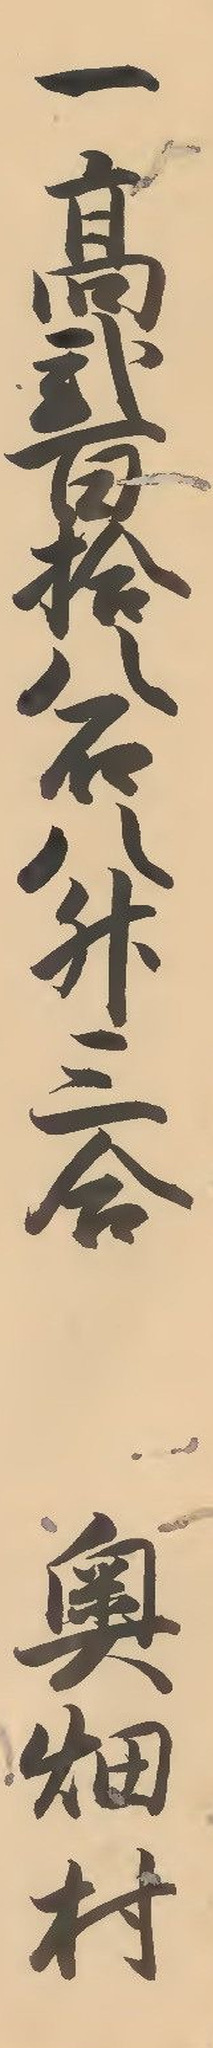一髙弐百拾八石八升三合奥畑村
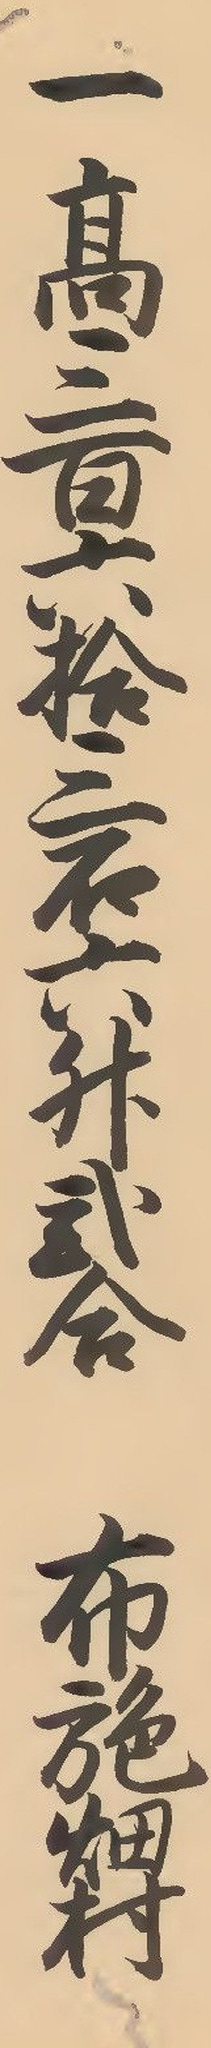一髙三百六拾三石六升弐合布施畑村
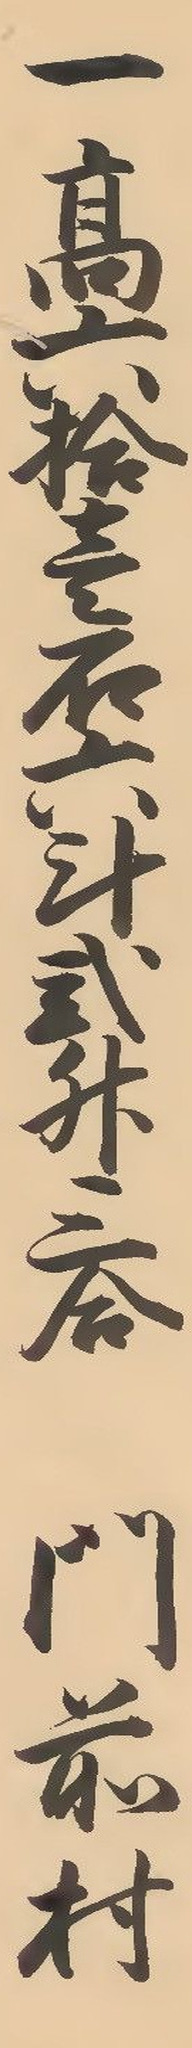一髙六拾壱石六斗弐升三合門前村
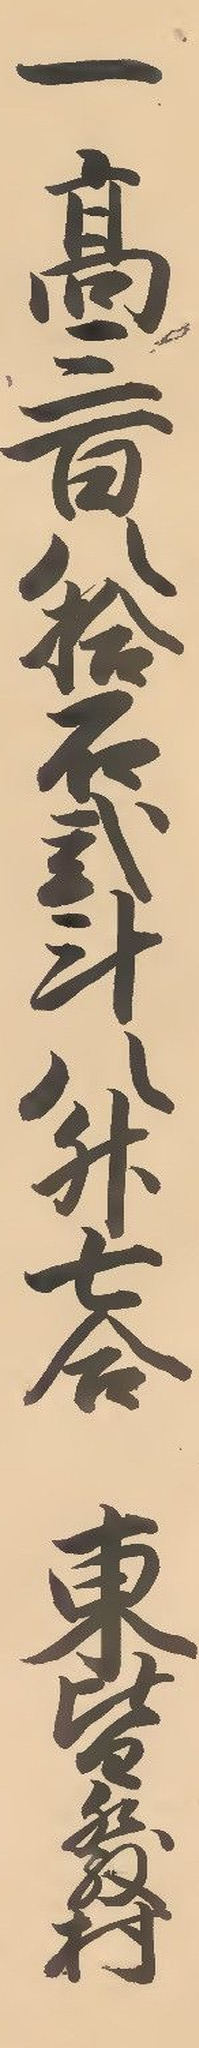一髙三百八拾石弐斗八升七合東皆發村
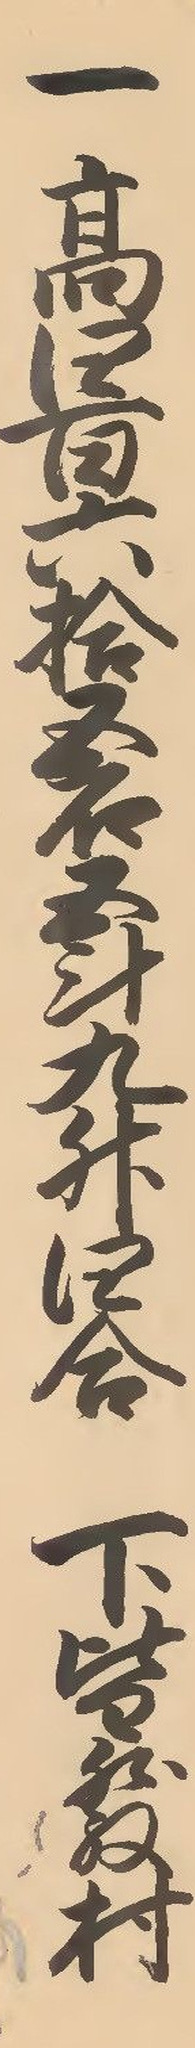一髙四百六拾五石五斗九升四合下皆發村
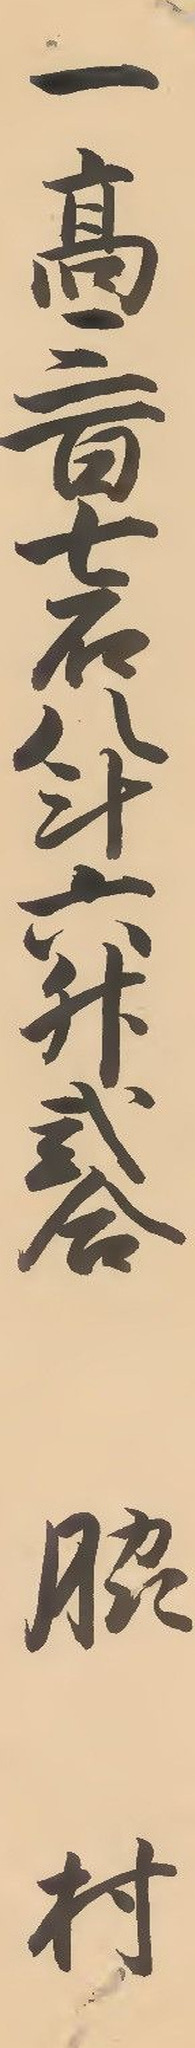一髙三百七石八斗六升弐合脇村
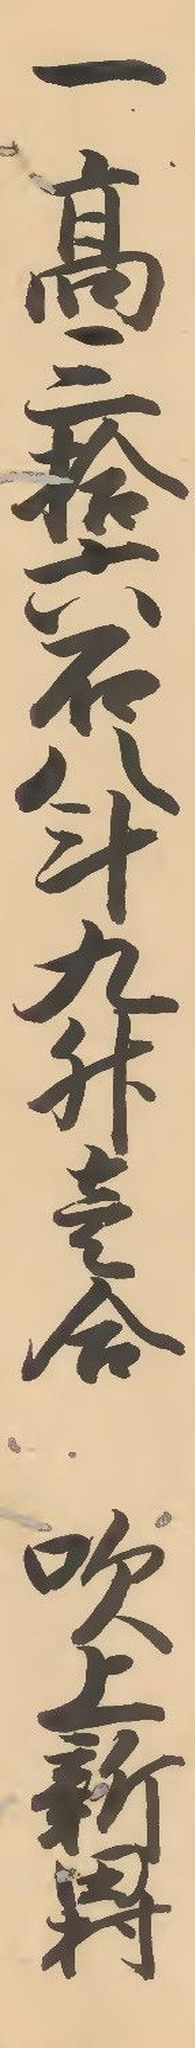一髙三拾六石八斗九升壱合吹上新田村

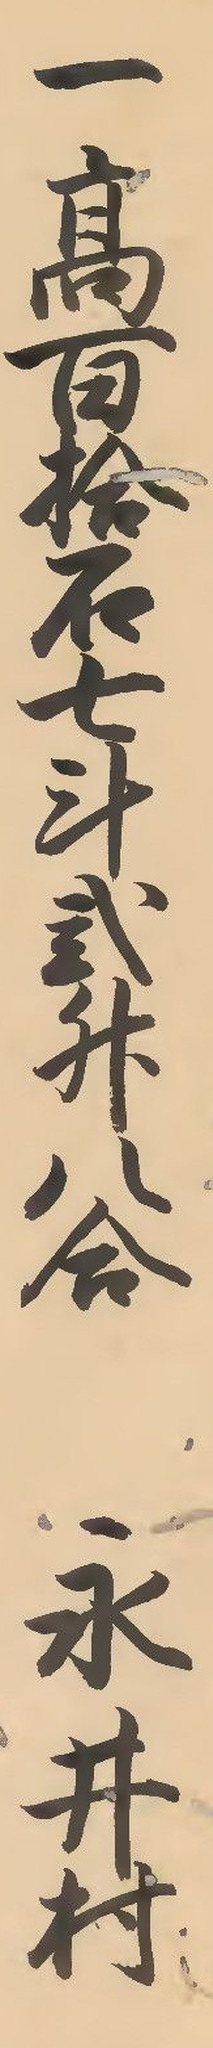一髙百拾石七斗弐升八合永井村
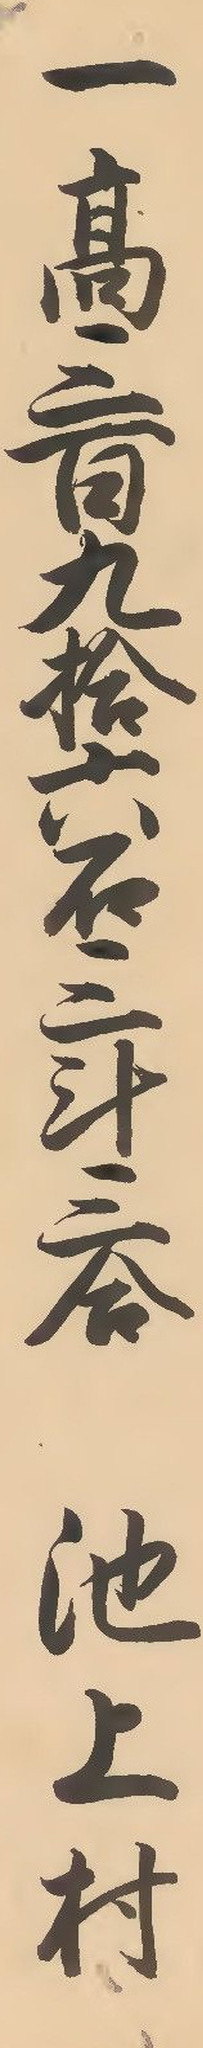一髙三百九拾六石三斗三合池上村
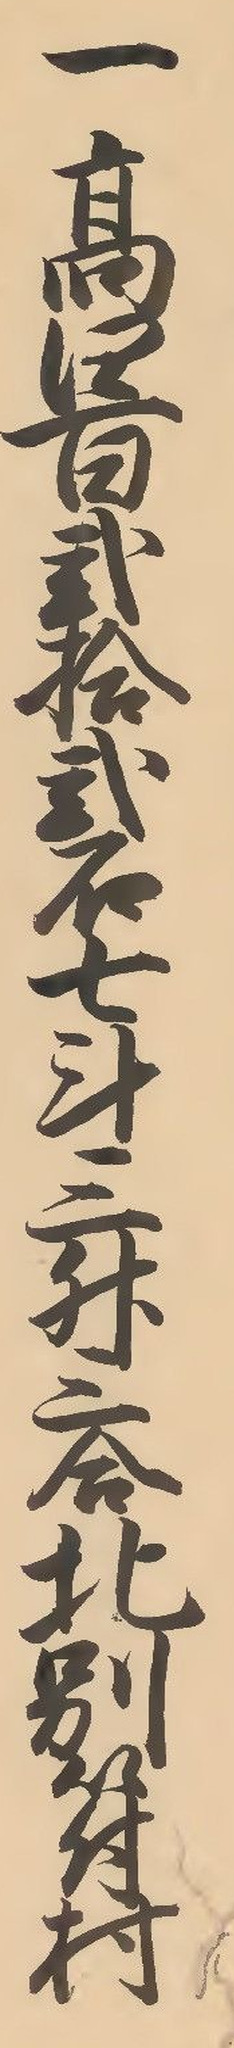一髙四百弐拾弐石七斗三升三合北別府村
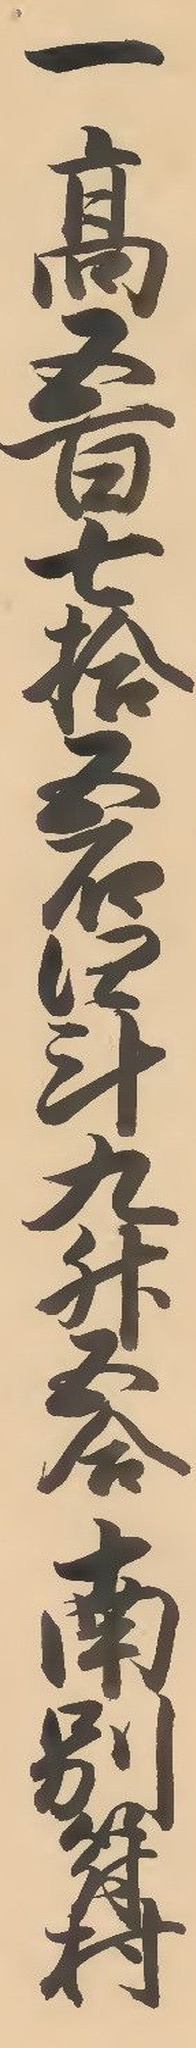一髙五百七拾五石四斗九升五合南別府村
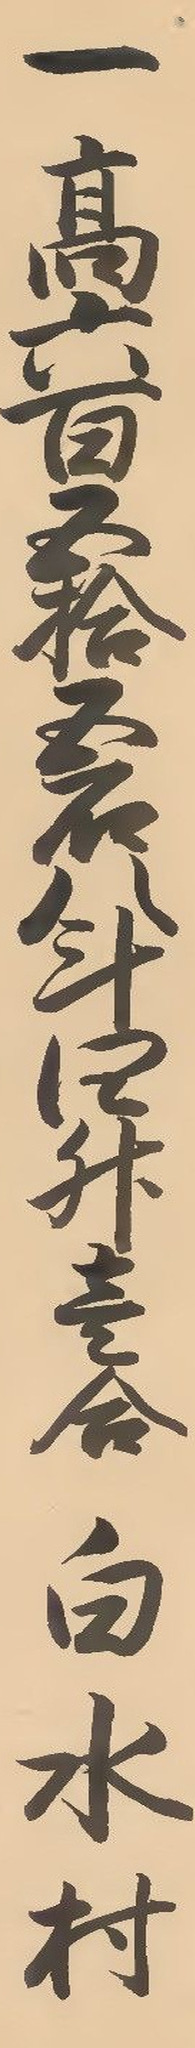一髙六百五拾五石八斗四升壱合白水村
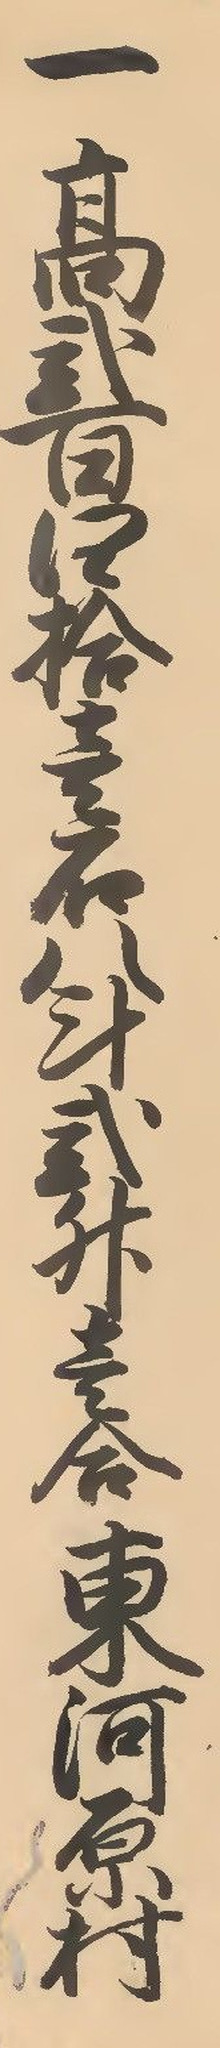一髙弐百四拾壱石八斗弐升壱合東河原村
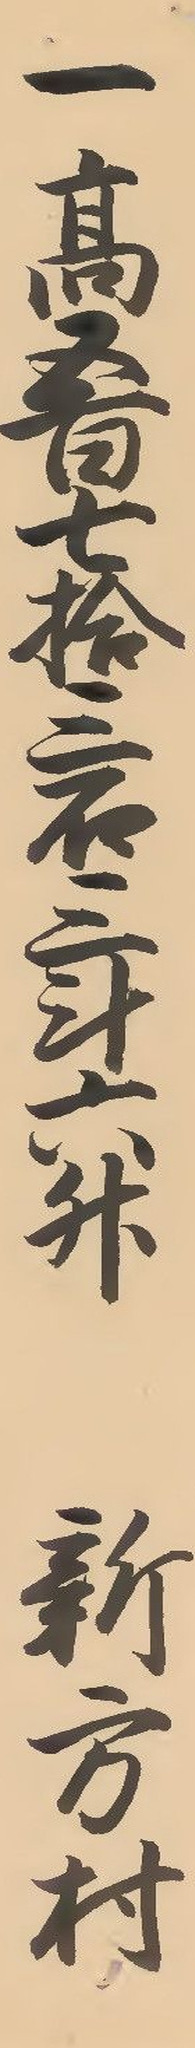一髙五百七拾三石三斗六升新方村
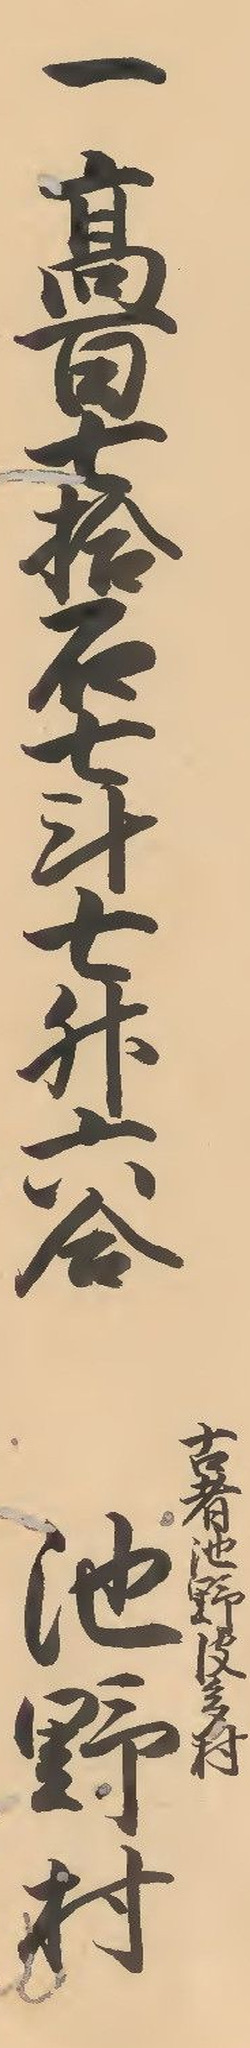一髙百七拾石七斗七升六合池野村
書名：播磨国郷帳
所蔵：国立公文書館 National Archives of Japan
